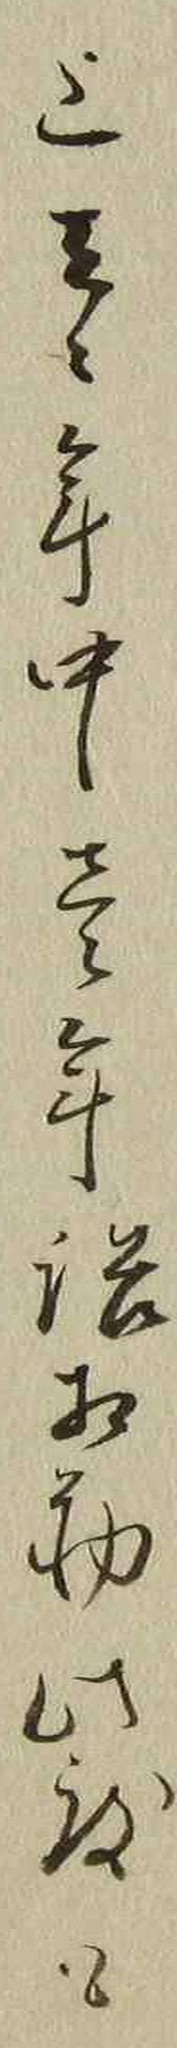上去々年中壱年詰相勤此度も
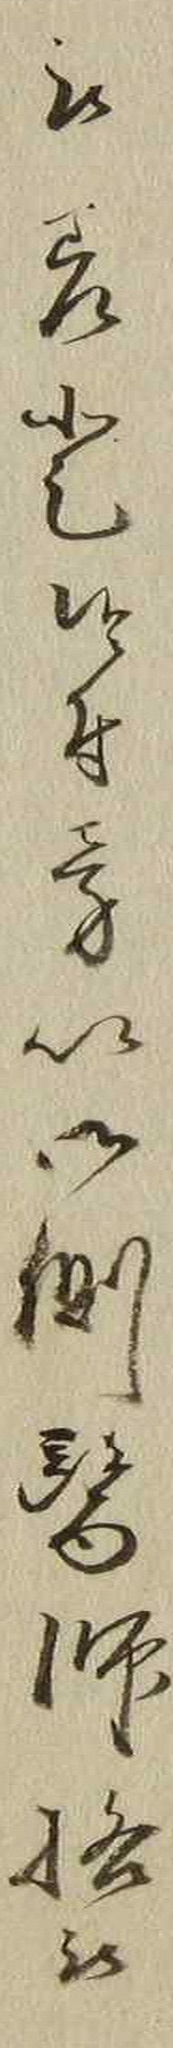被差登候ニ付旁以御側医師挌被
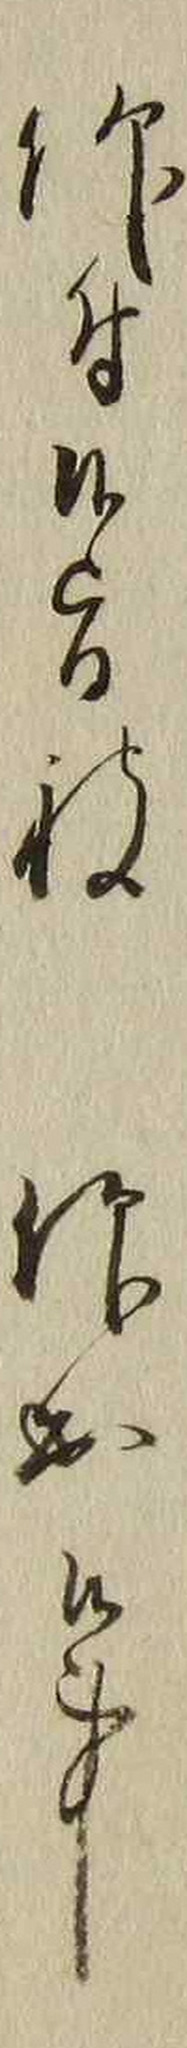仰付候旨被仰出候事
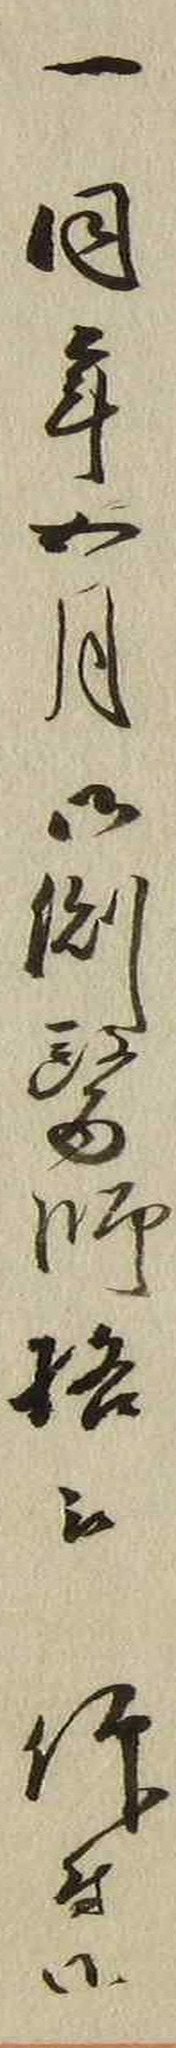一同年五月御側医師挌被仰付御
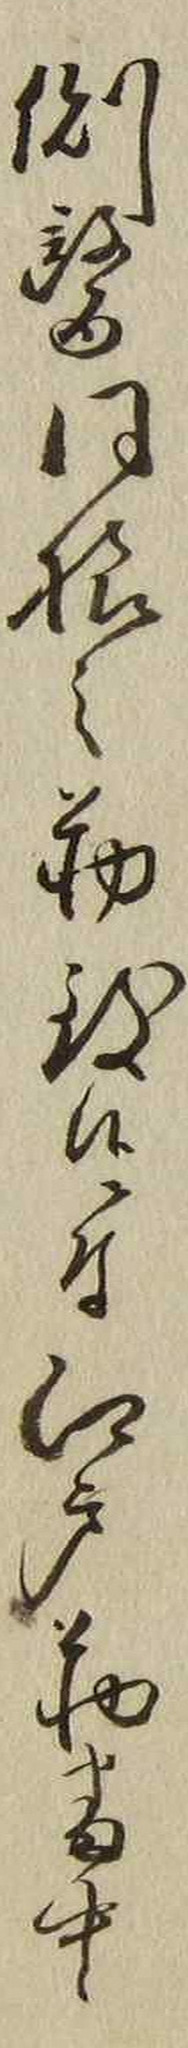側医同様之勤致候ニ付江戸勤番中
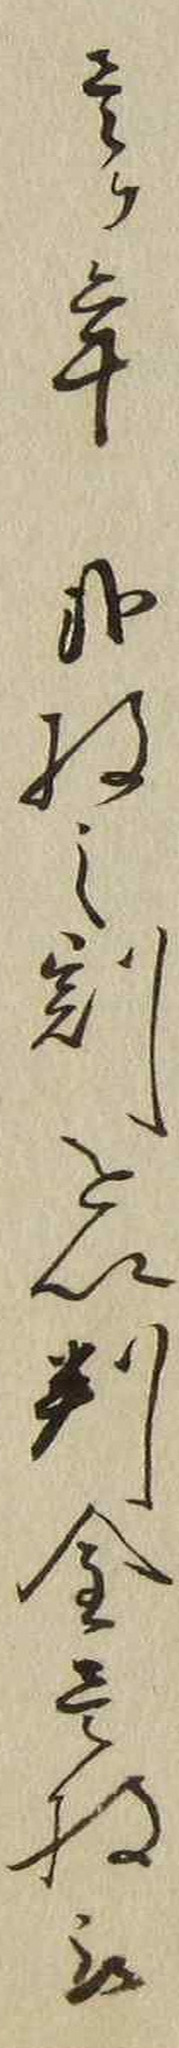壱ケ年弐枚之割を以判金壱枚被
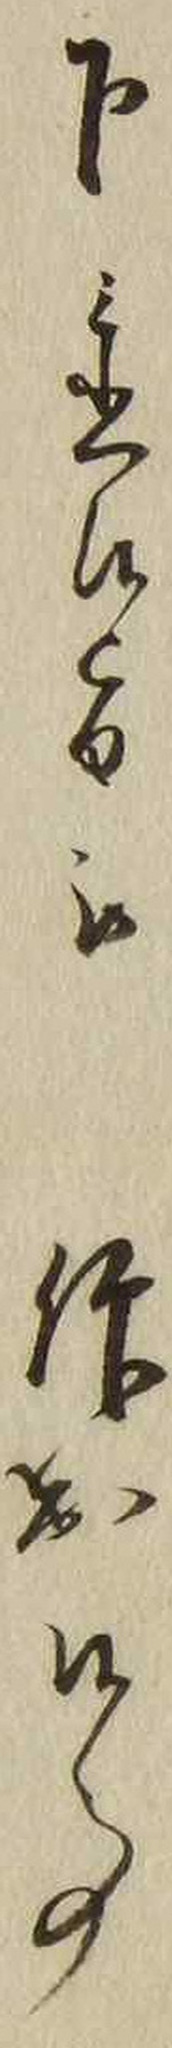下置候旨被仰出候事

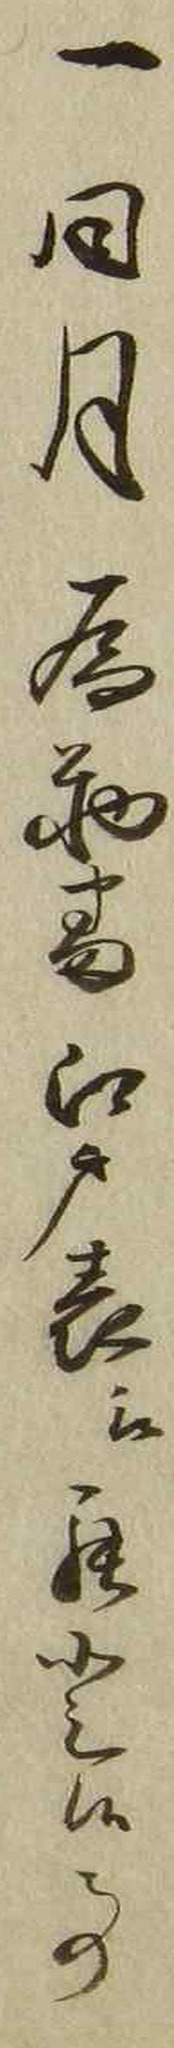一同月為勤番江戸表江罷登候事
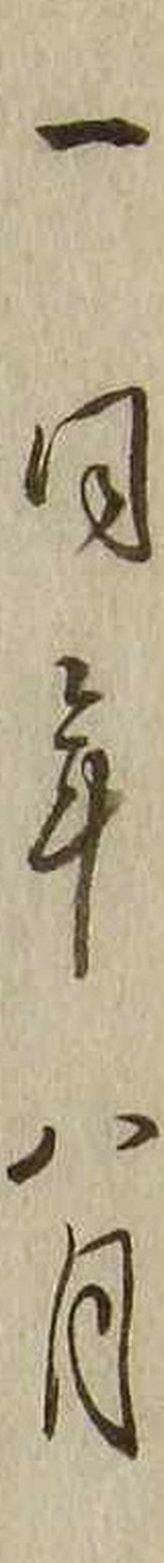一同年八月
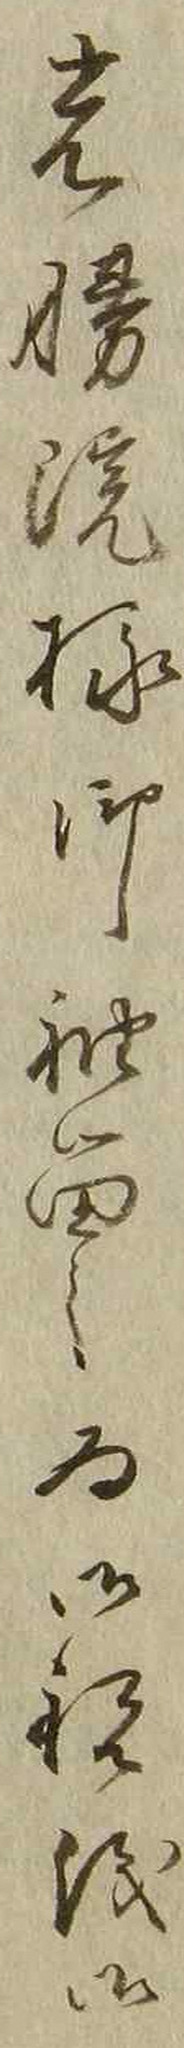光勝院様御袖留之為御祝儀御
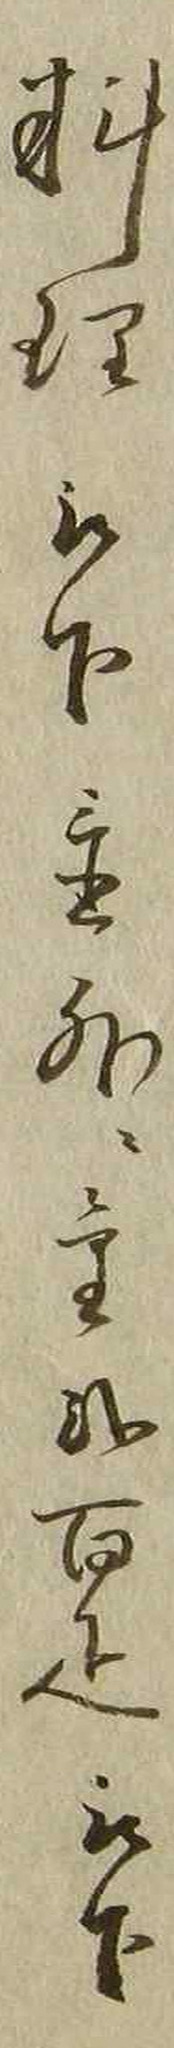料理被下置外ニ金弐百疋被下
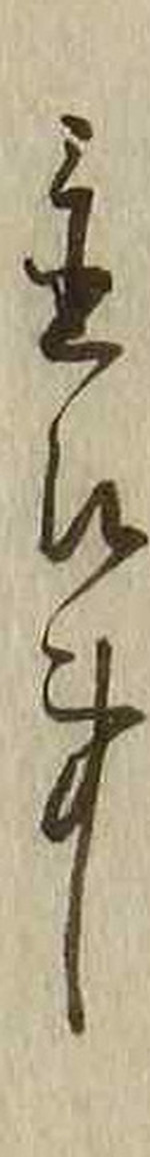置候事
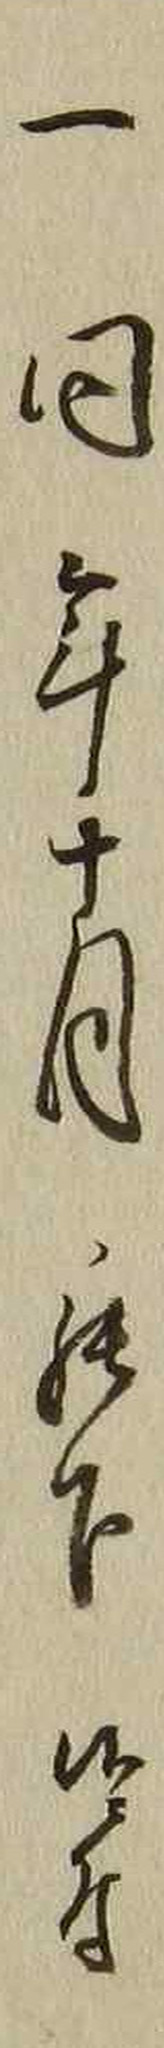一同年十月罷下候ニ付
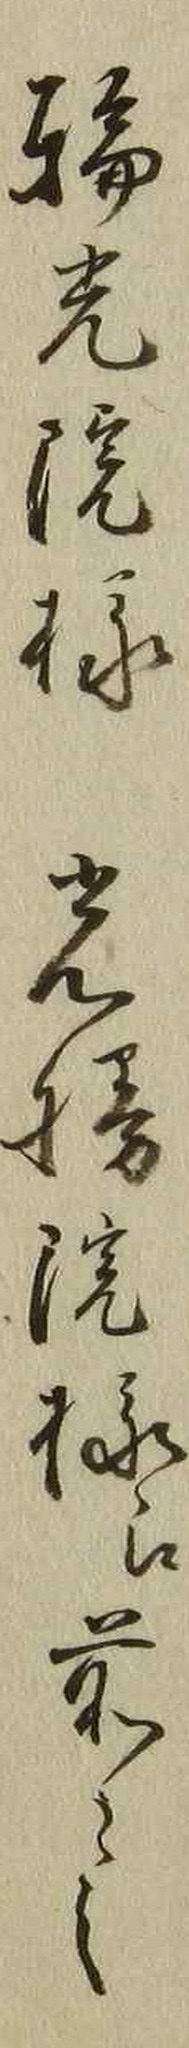輪光院様光勝院様江前々之
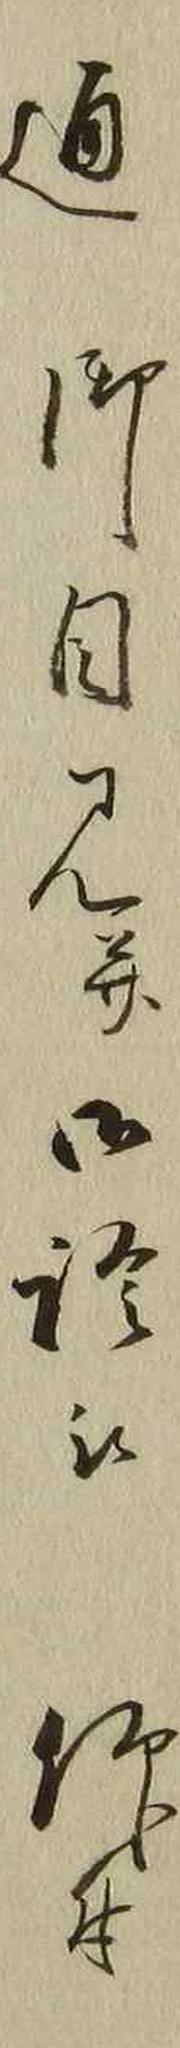通御目見并御診被仰付
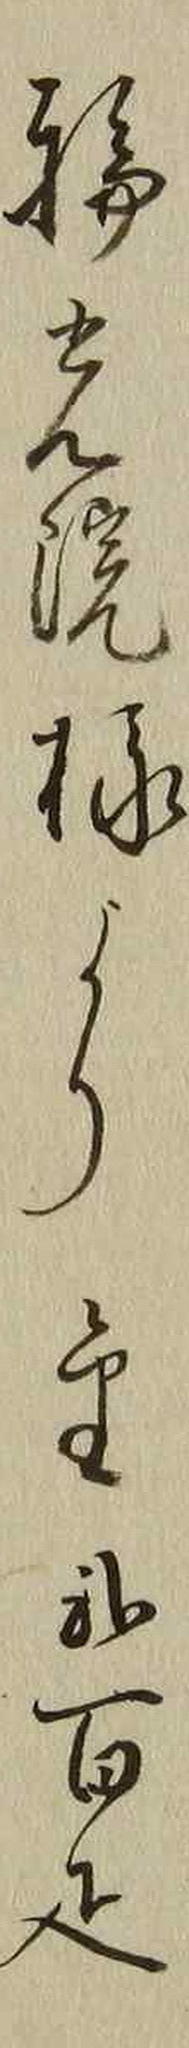輪光院様より金弐百疋
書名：諸士系譜　巻之68　を之部2
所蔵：会津若松市立会津図書館
